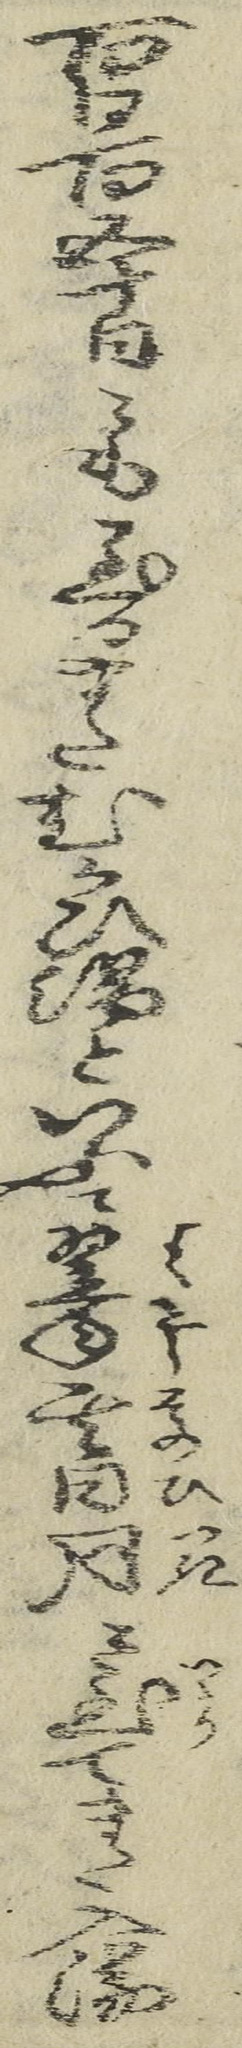百日百五十日にも至るまたむかひ湯といふて翌年其日月に至てまた入湯
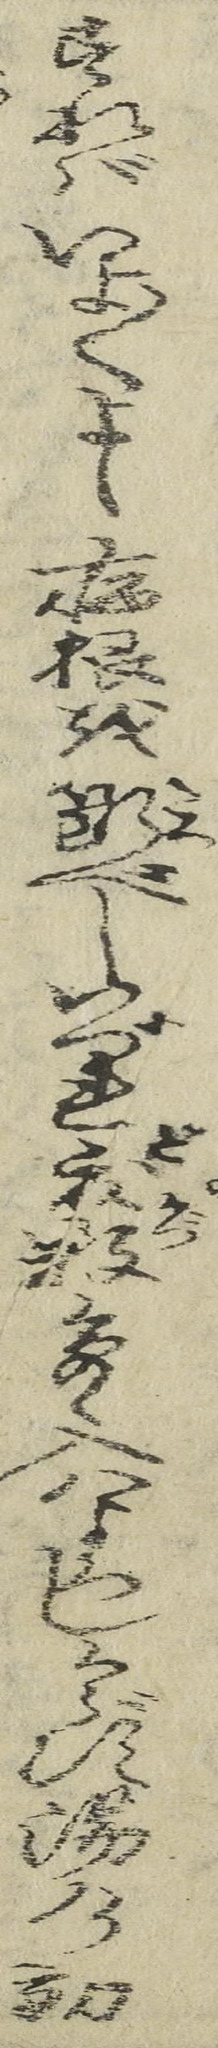すればいよ〳〵よし病根を断べしいづれ度数多く入はよろしからず湯乃効
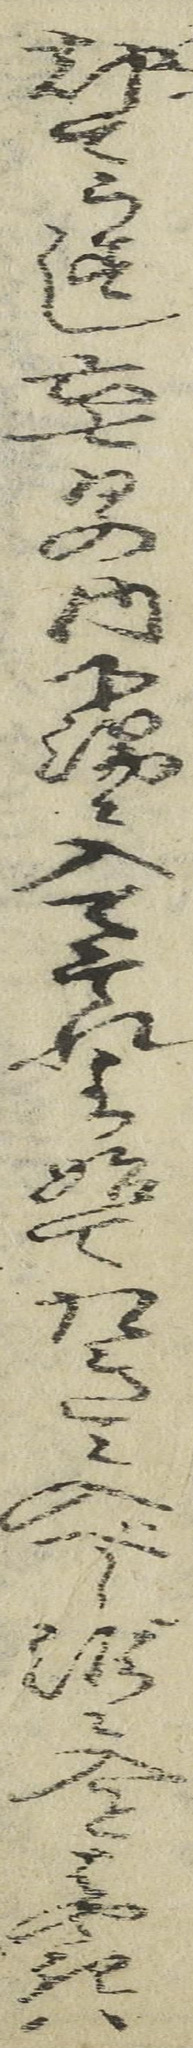却てうすし六七日の内下湯に入てそれより始てた？きに入べし瀧に入こ？とはやきは
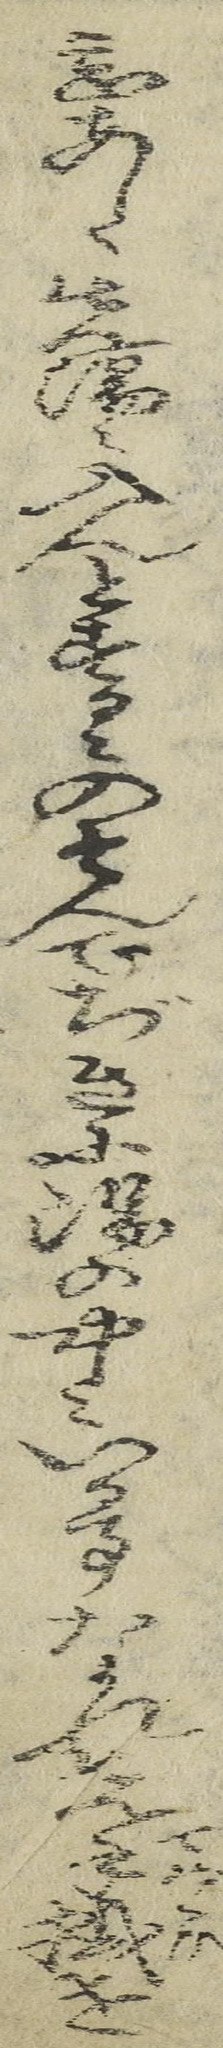甚あしく先湯に入んとするにのそんでぢきに湯の中にいる事なかれは手織を
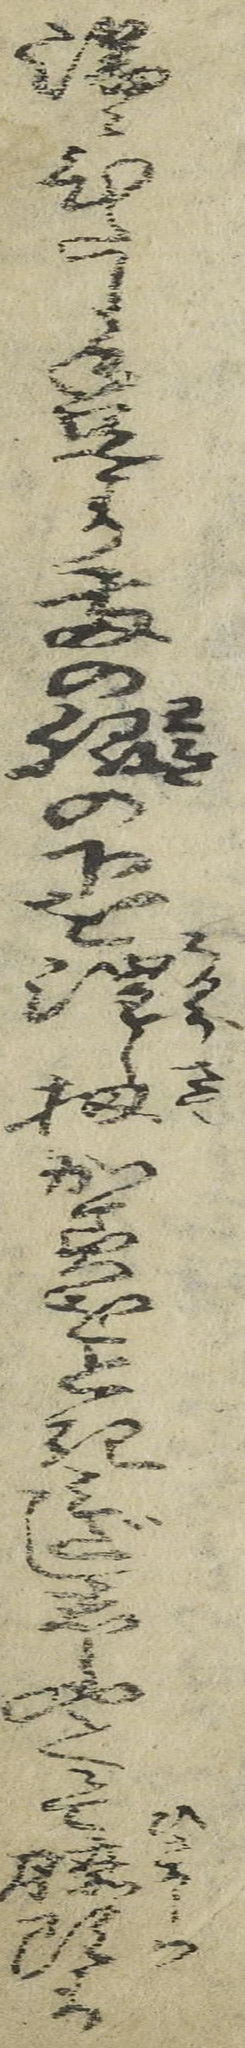湯にひたし手足より両の脇の下を滑し扨かみをときみだしひ？しやくにて膝頭より

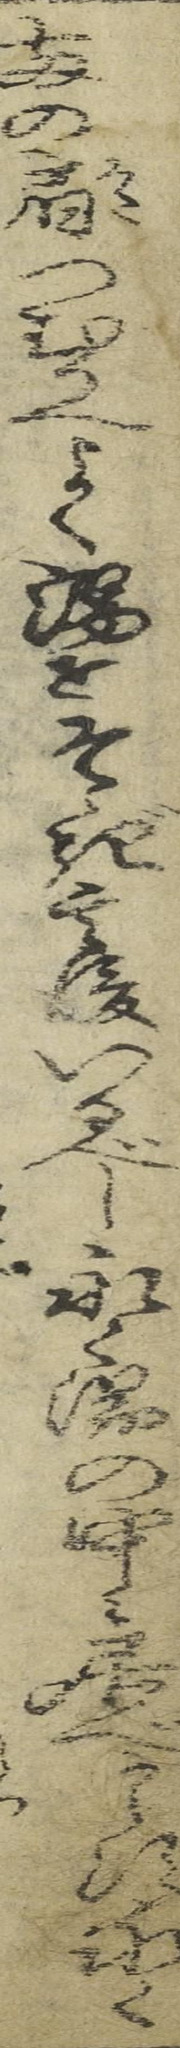両の肩つむりへよく湯をそゝぎ其後いるべし永く湯の中に居べからず永く

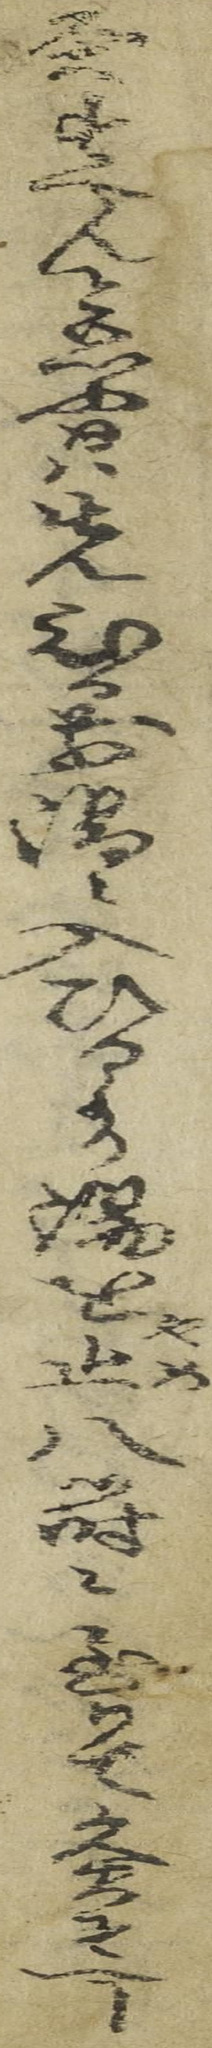灸すへんと思ふ日は先ひる前お湯に入ひるより湯を止八ツ時に至りて灸すへし
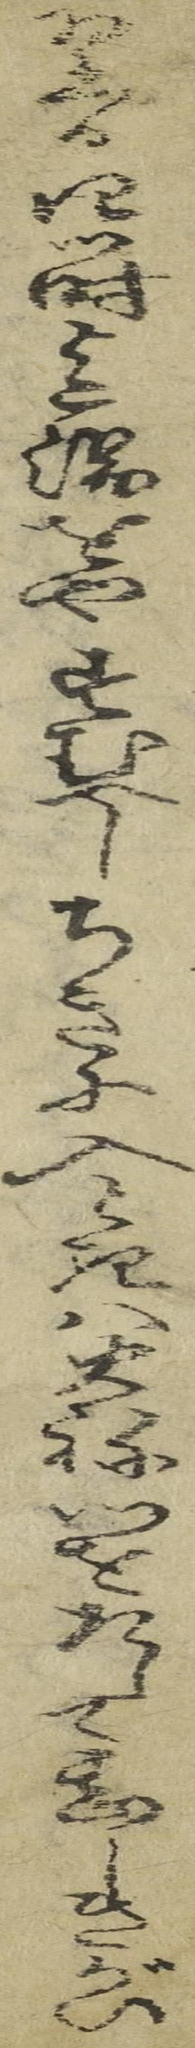翌日四ツ時迄湯をやすむへしちきに入ときは火ねつをたして甚しきがひ
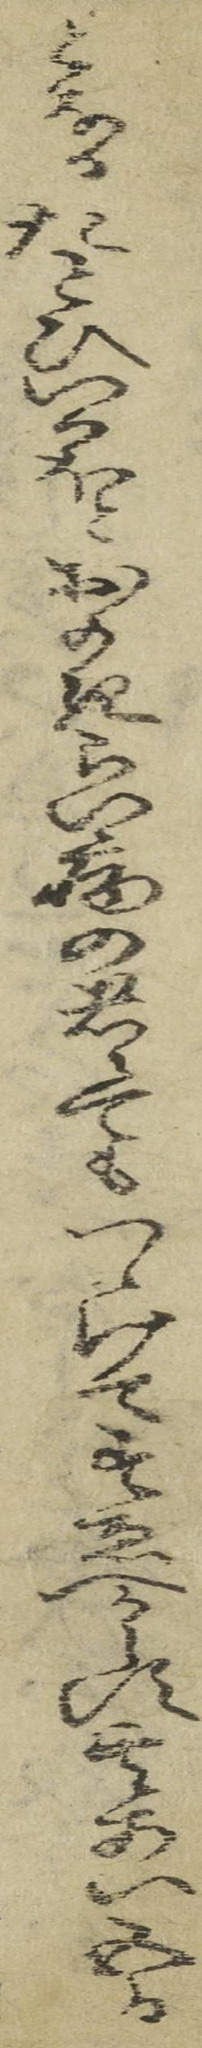となるたとひいかほとおもきらい病の者てもつゝけてすゑへからす其あい五日
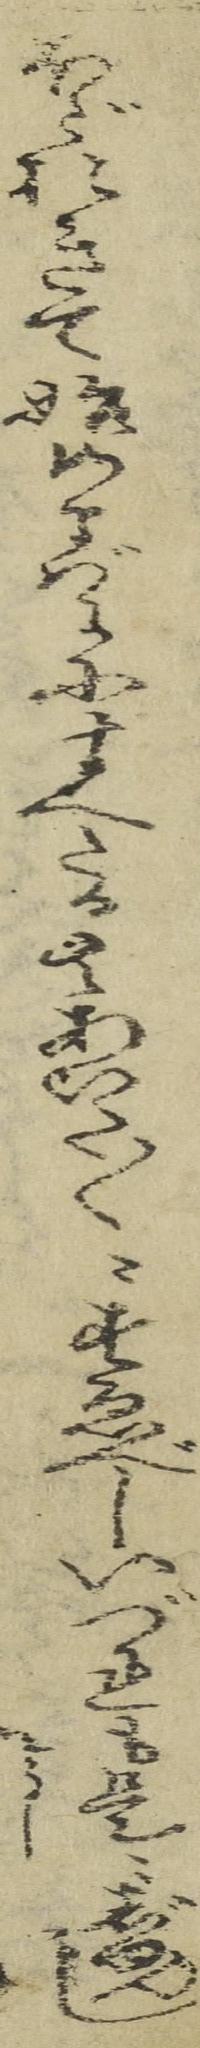ほどおきて始めわづかにすへたる其あいた〳〵にすゑべしいづれも是二じゆんし
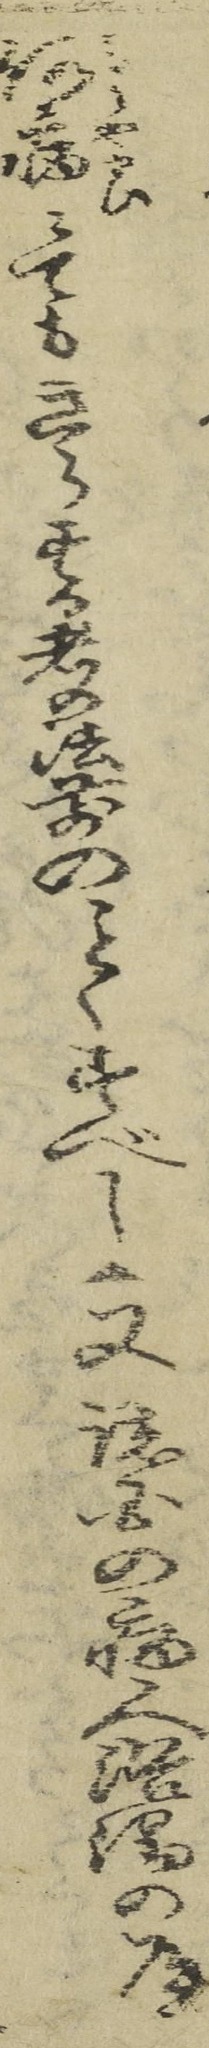何病にてもきうする者の法前のことくすべし▲又諸国の病人治湯の道
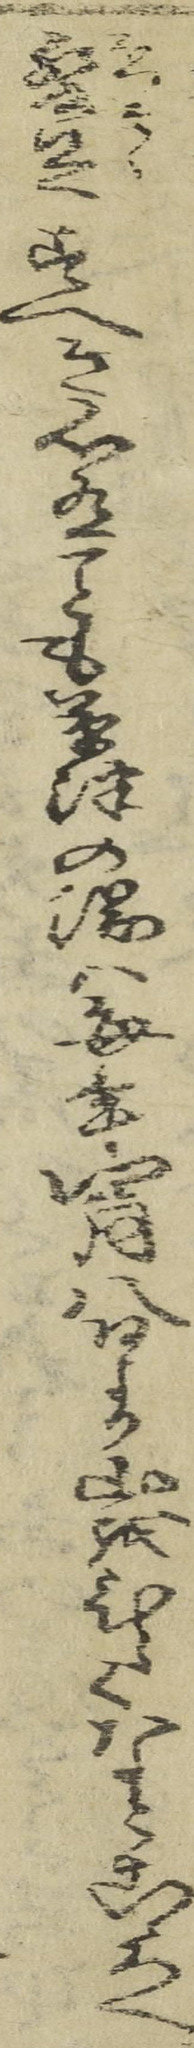発足すへき石有てとも草津の湯は毎年四月八日より山をひらくなとこゝろへ
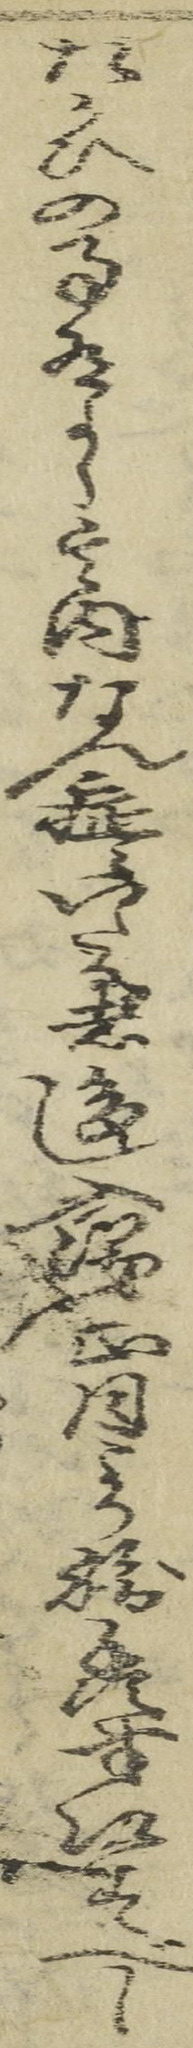たかひの事有よし其内なん症にいたる者多し入湯正月より勝手次第にすべし
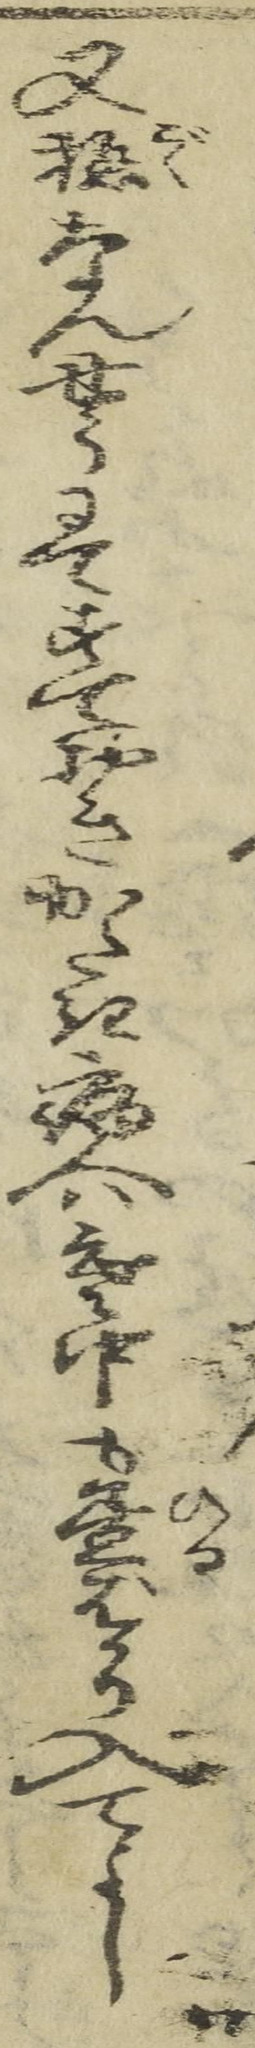又極なんせうにてすておきかたき病人は寒中も昼ばかり入てよし
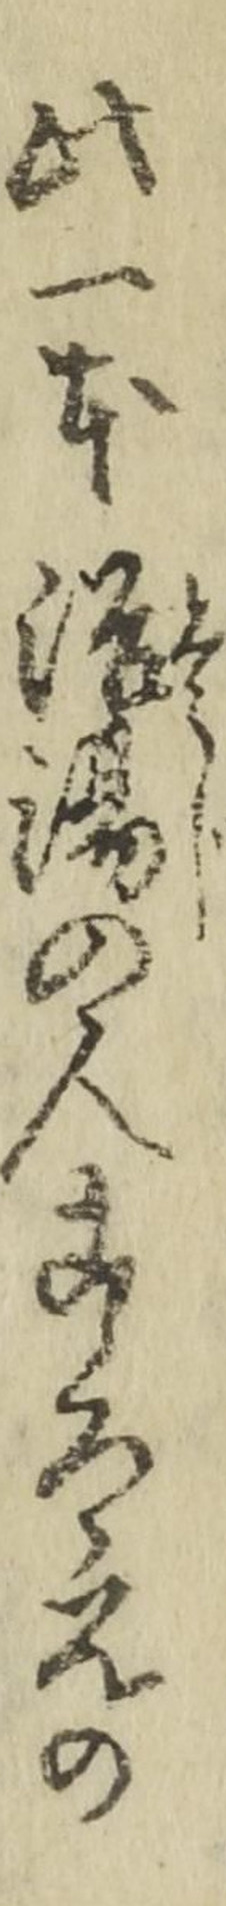此一本治湯の人こゝろえの
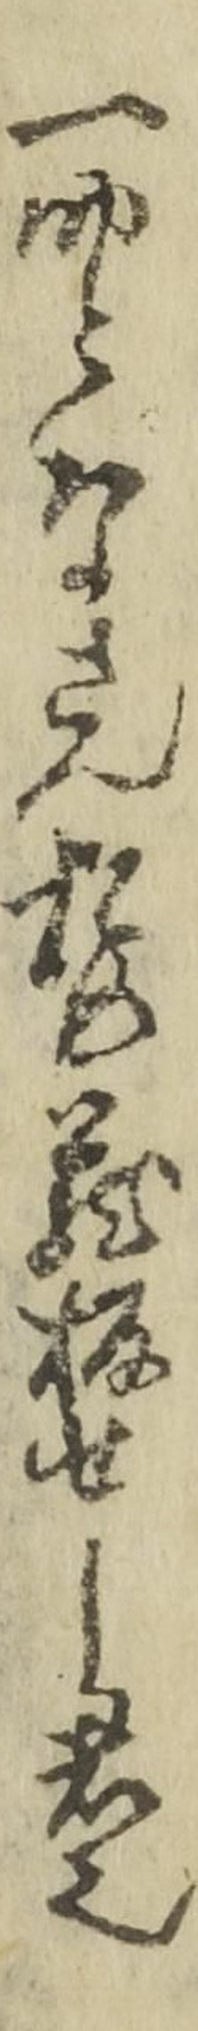一助となさんため蔵板せし者也
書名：草津温泉　入湯案内記
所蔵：東京大学地震研究所図書室 Earthquake Research Institute Library, The University of Tokyo, JAPAN
